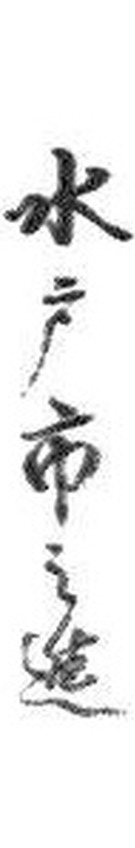水戸市之進

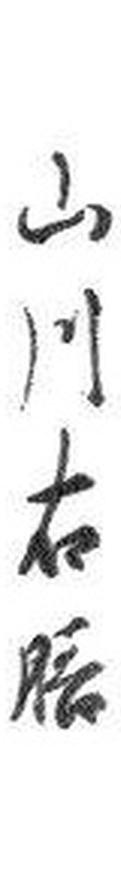山川右膳
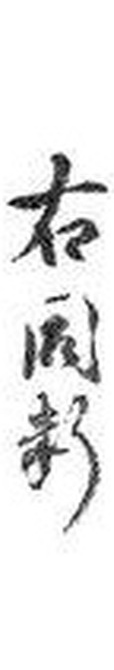右同断
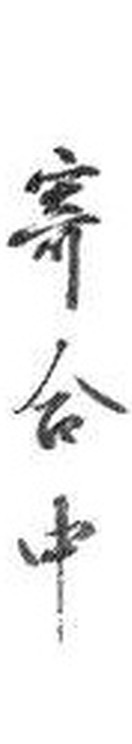寄合中
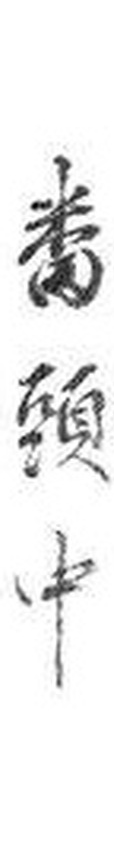番頭中
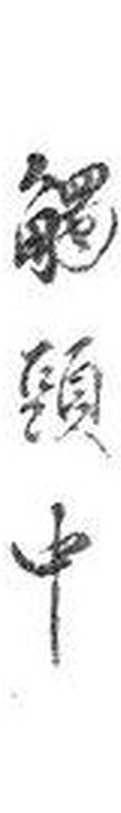触頭中
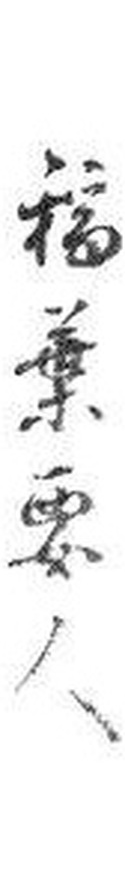稲葉要人
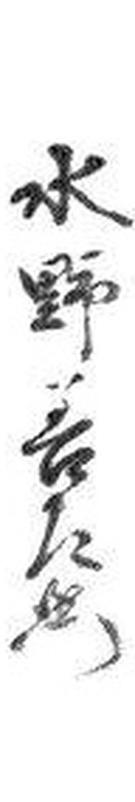水野善左衛門
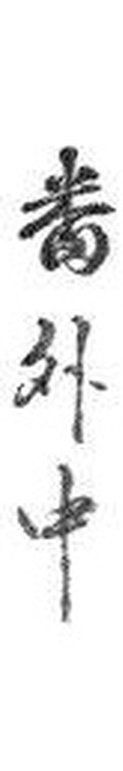番外中
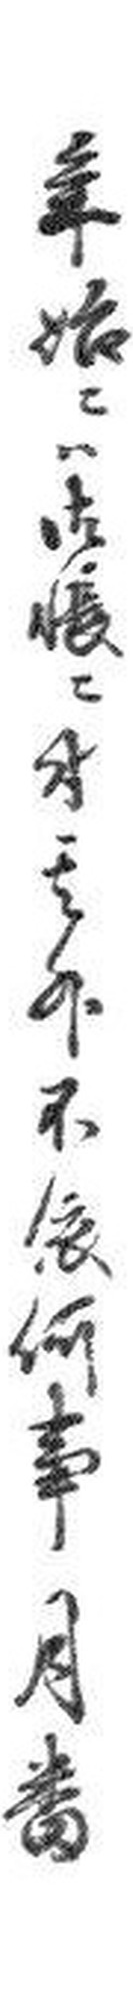年始ニハ御帳ニ付其外不依何事月番
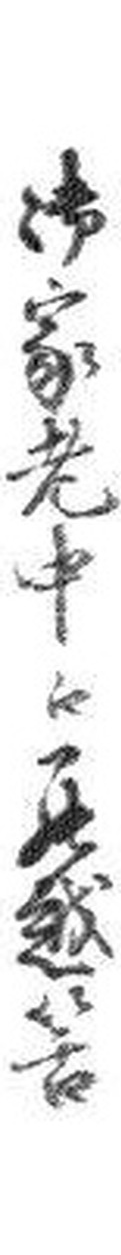御家老中江罷越筈
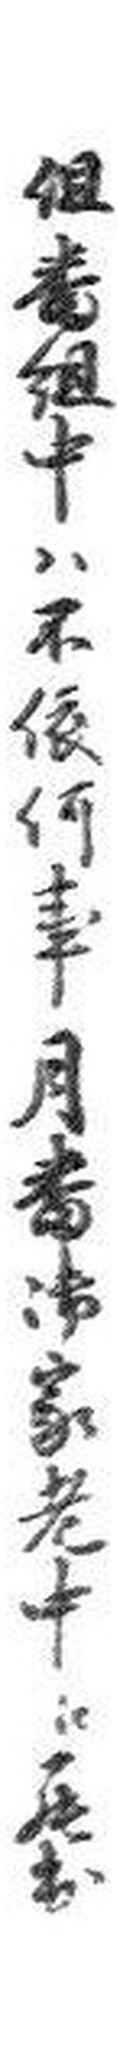但番組中ハ不依何事月番御家老中江罷出
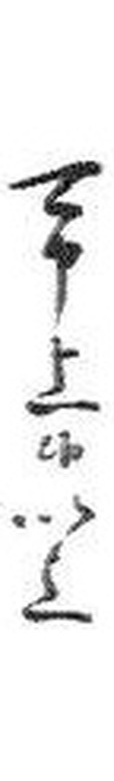可申上候以上
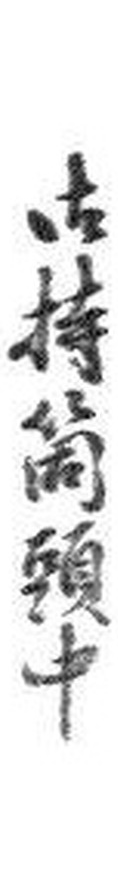御持筒頭中
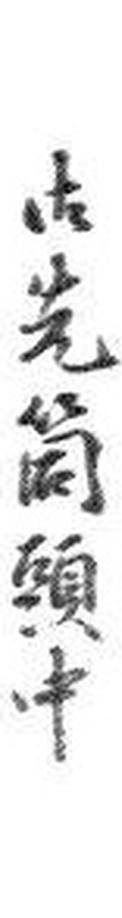御先筒頭中
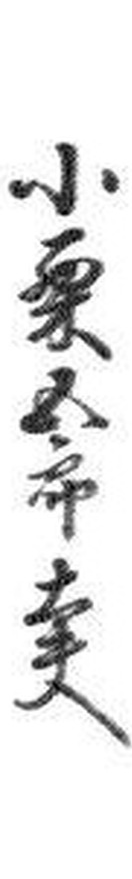小栗五郎太夫
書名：家譜 二十六 吉品公 従宝永七年到正徳二年
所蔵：福井県文書館 Fukui Prefectural Archives
